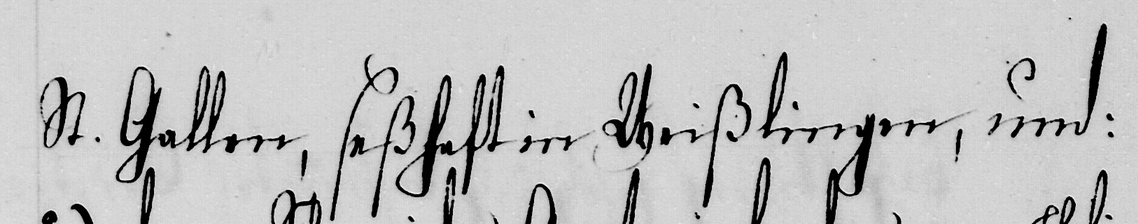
t. Gallen, seßhaft in Weißlingen, und:
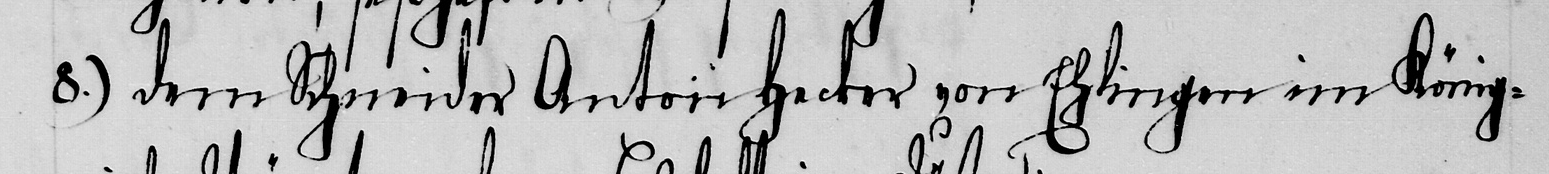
8.) dem Schneider Anton Hecker von Ehlingen im König¬
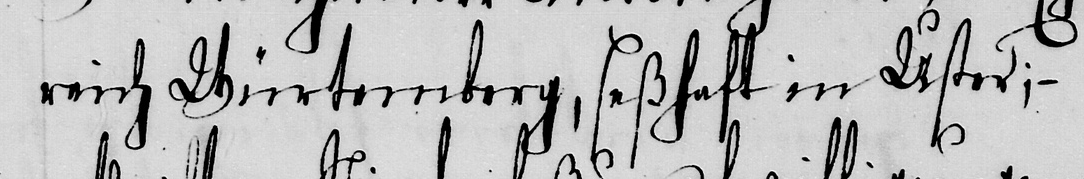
reich Würtemberg, seßhaft in Uster;
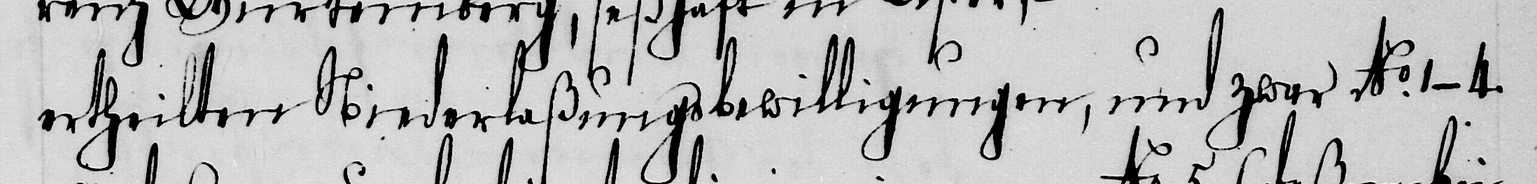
ertheilten Niederlaßungsbewilligungen, und zwar No. 1–4.
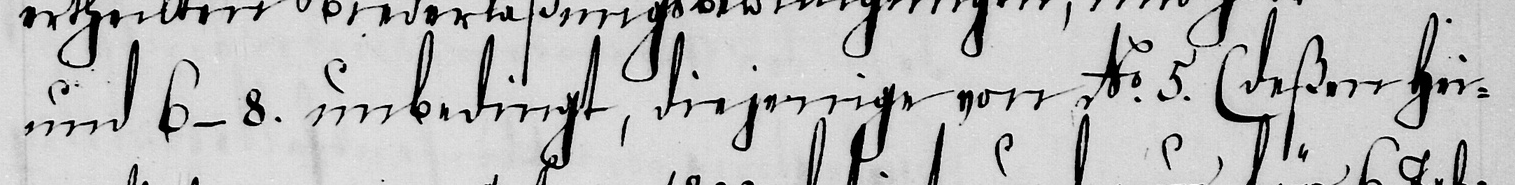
und 6–8. unbedingt, diejenige von No. 5. (deßen Hei¬
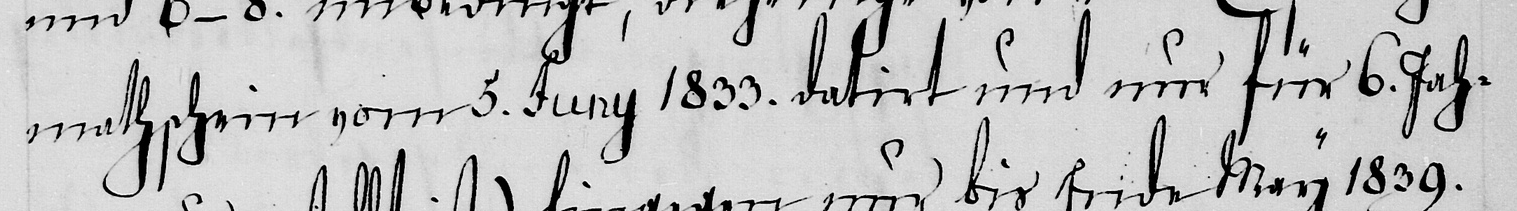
mathschein vom 5. Juny 1833. datirt und nur für 6. Jah¬
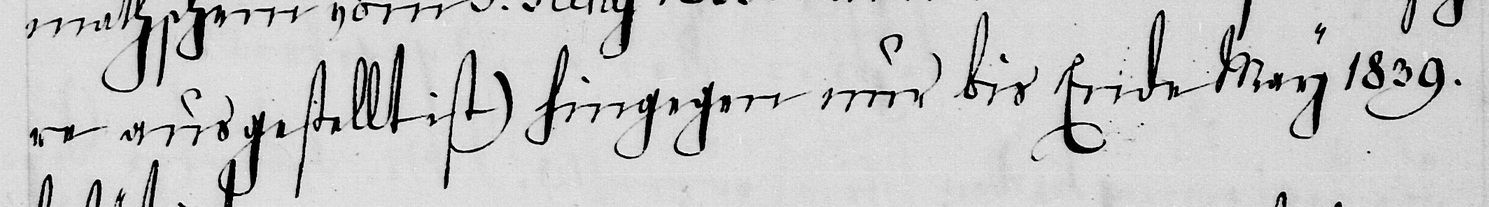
re ausgestellt ist) hingegen nur bis Ende May 1839.
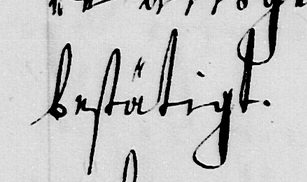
bestätigt.
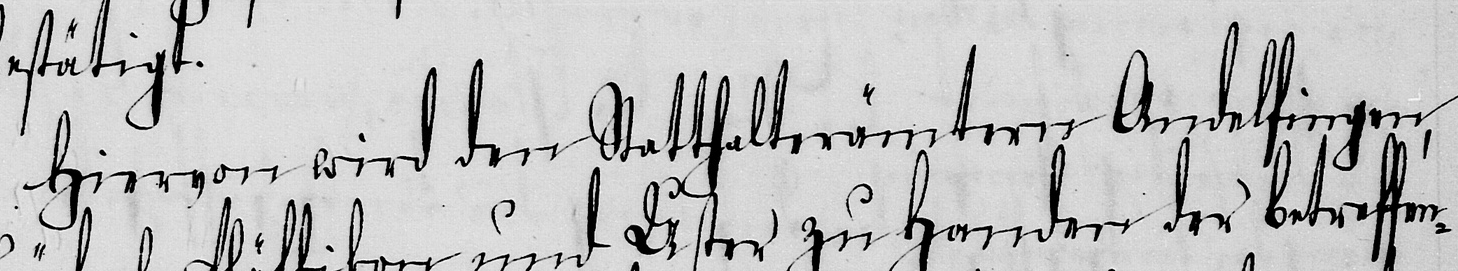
Hiervon wird den Statthalterämtern Andelfingen,
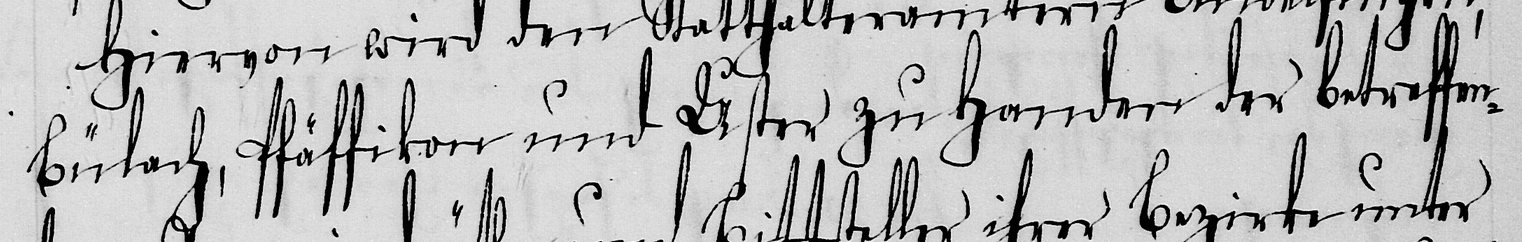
Bülach, Pfäffikon und Uster zu Handen der betreff¬
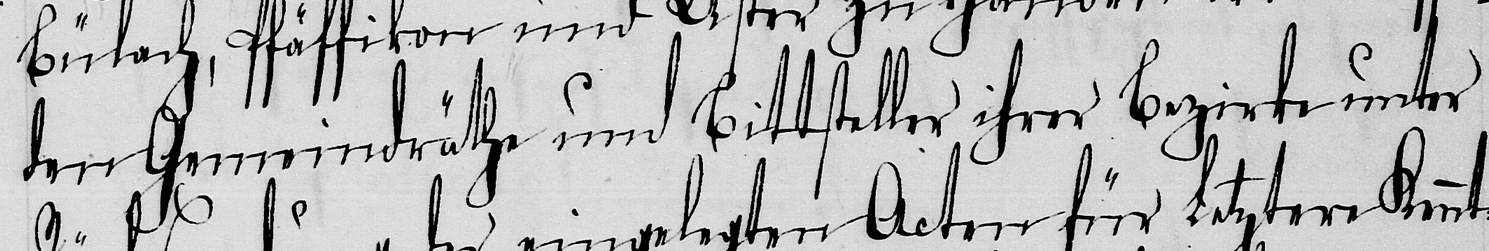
den Gemeindräthe und Bittsteller ihrer Bezirke unter
